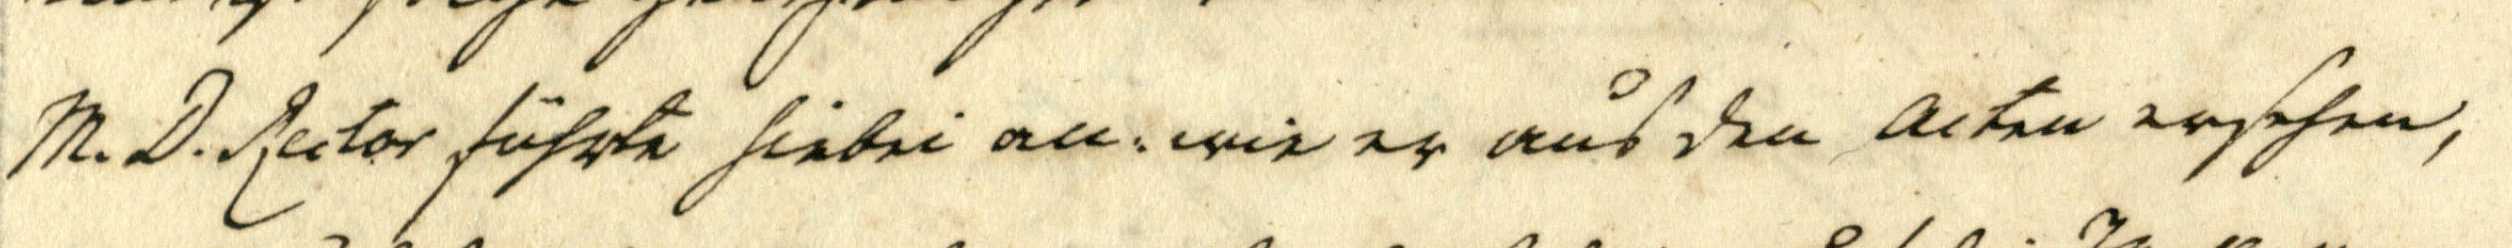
M. D. Rector führte hiebei an: wie er aus den Acten ersehen,
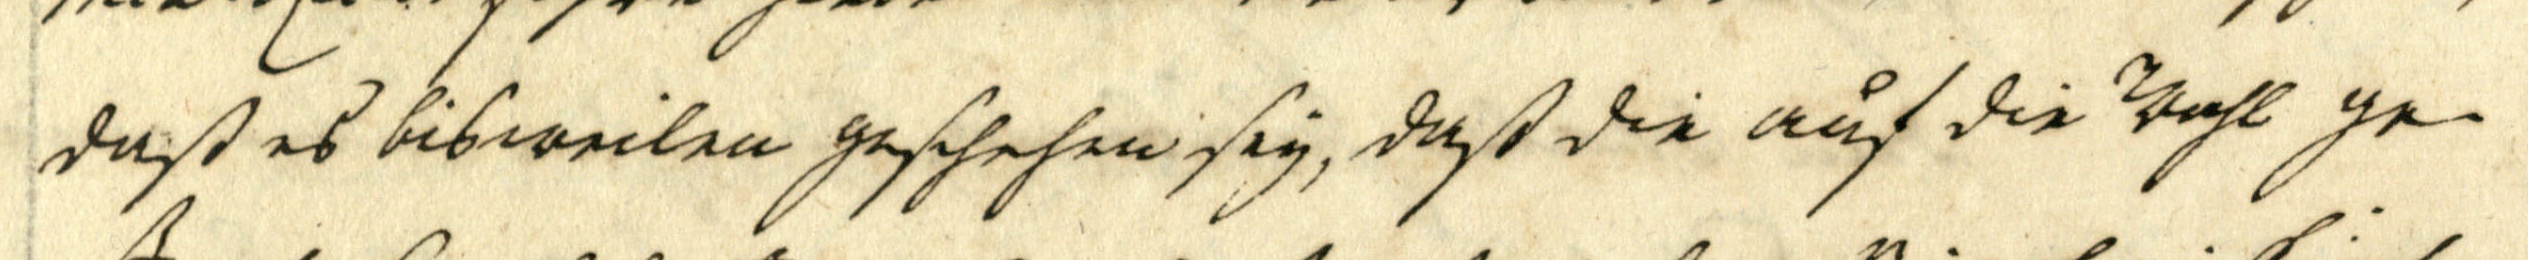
daß es bisweilen geschehen seÿ, daß die auf die Wahl ge¬
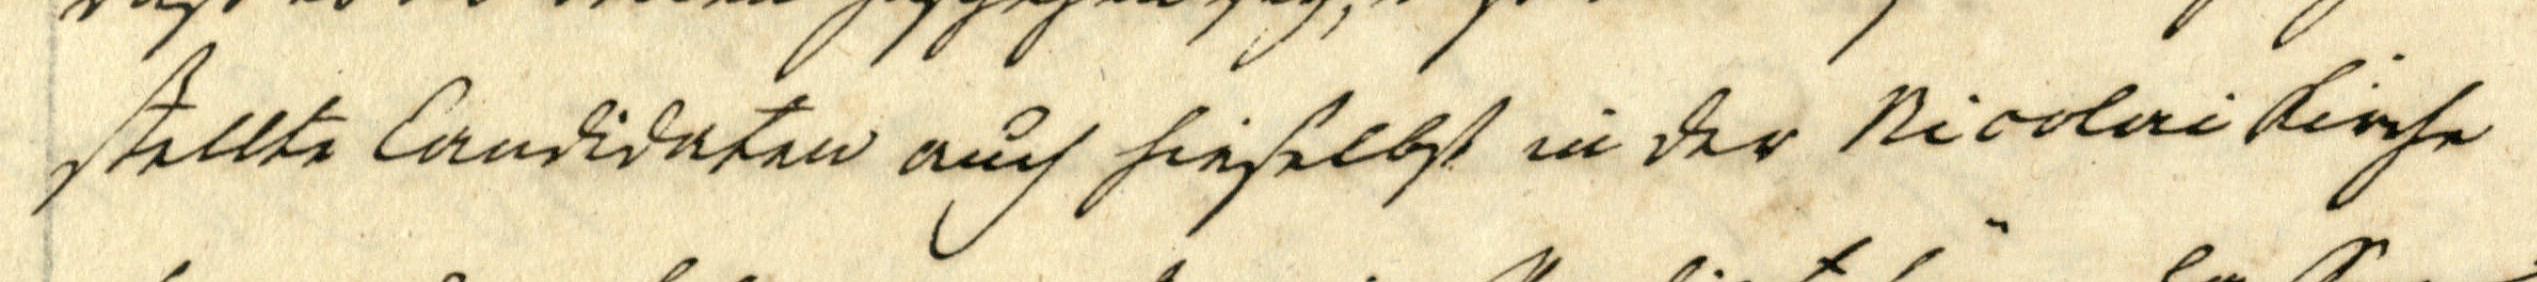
stellte Candidaten auch hieselbst in der Nicolai Kirche
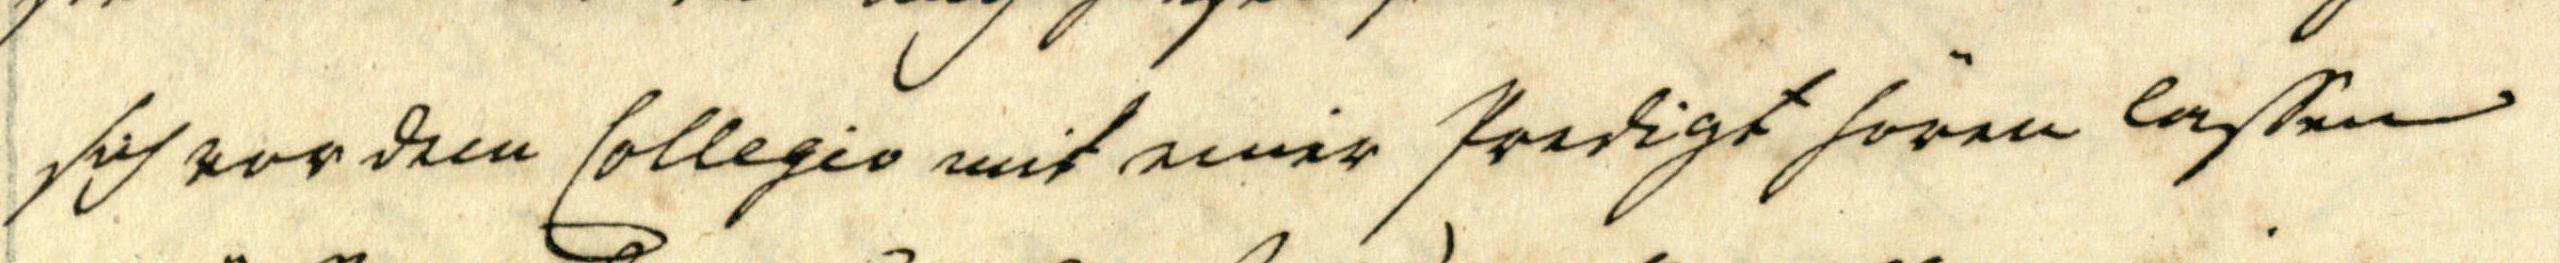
sich vor dem Collegio mit einer Predigt hören lassen
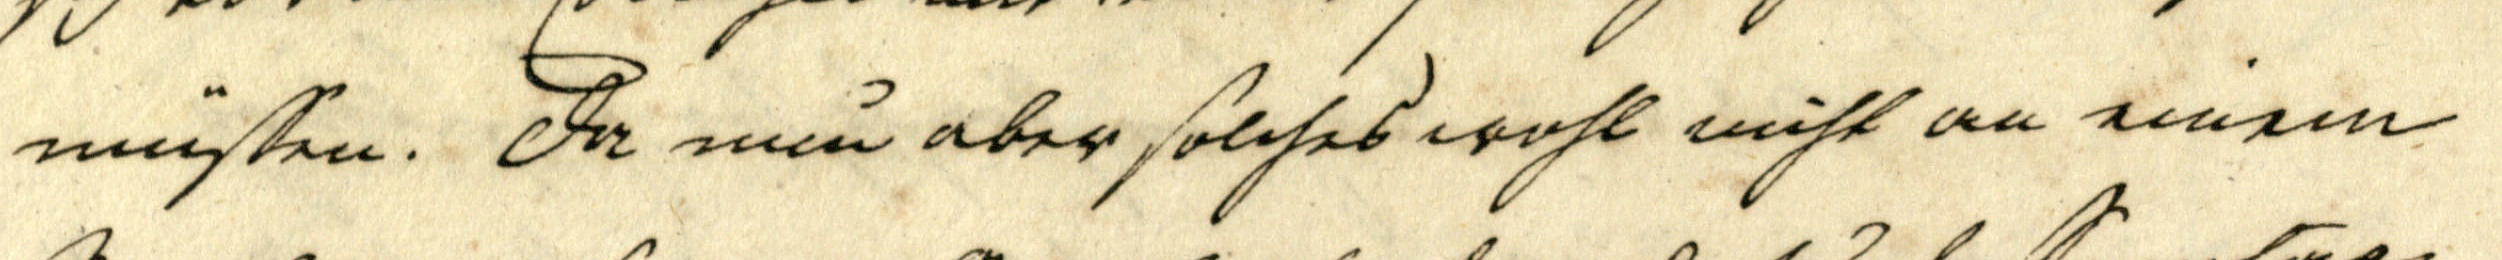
müssen. Da nun aber solches wohl nicht an einem
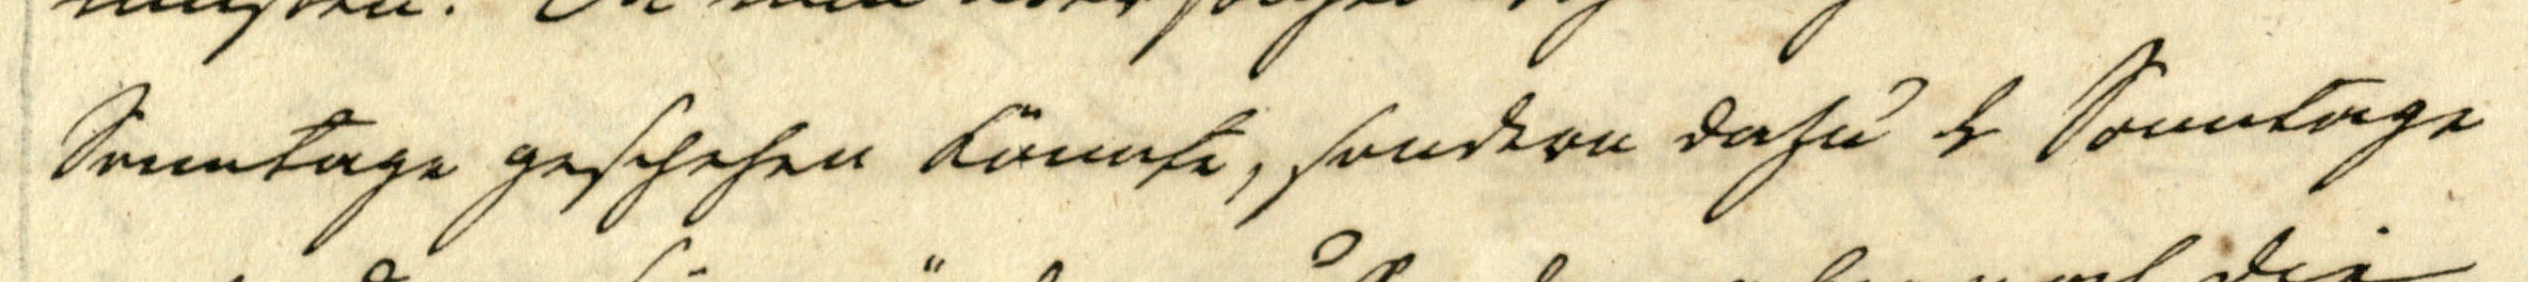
Sonntage geschehen könnte, sondern dazu 2 Sonntage
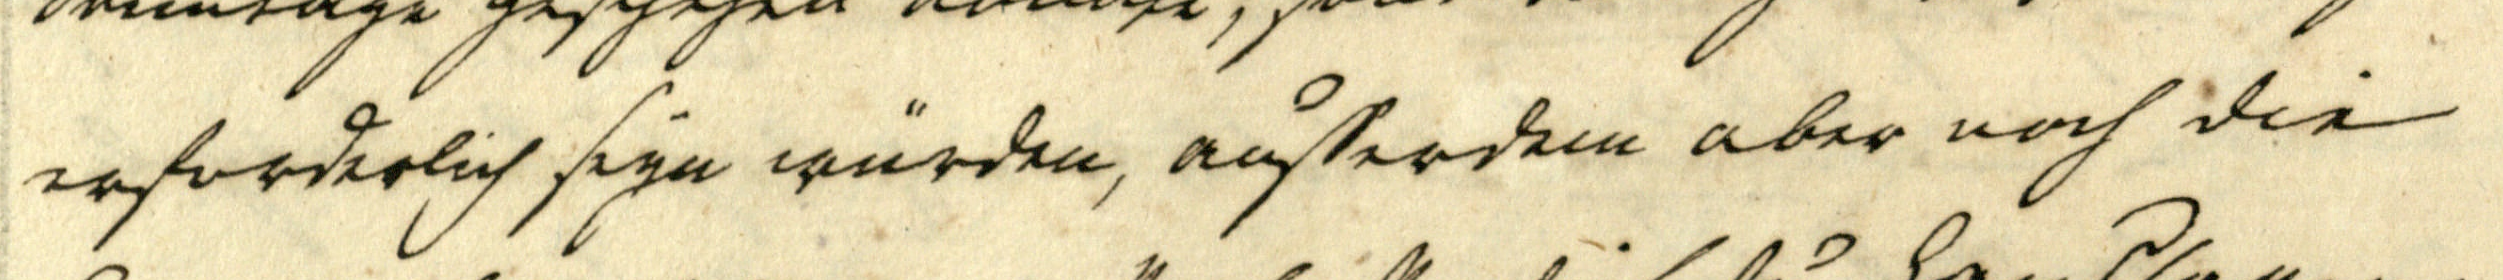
erforderlich seÿn würden, ausserdem aber noch die
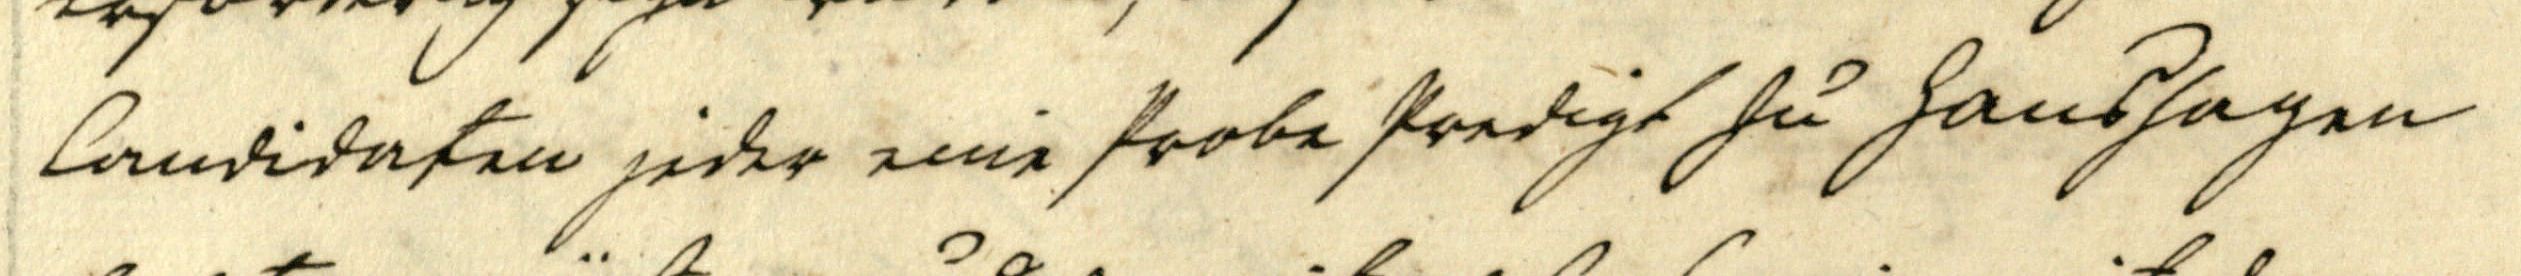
Candidaten jeder eine Probe Predigt zu Hanshagen
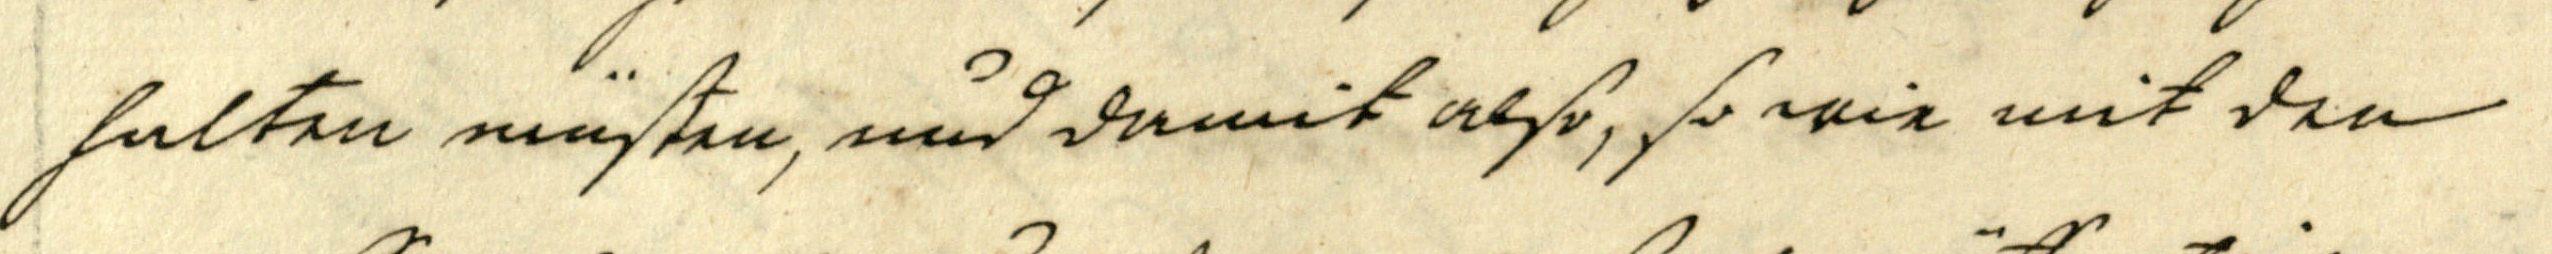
halten müsten, und damit also, so wie mit den
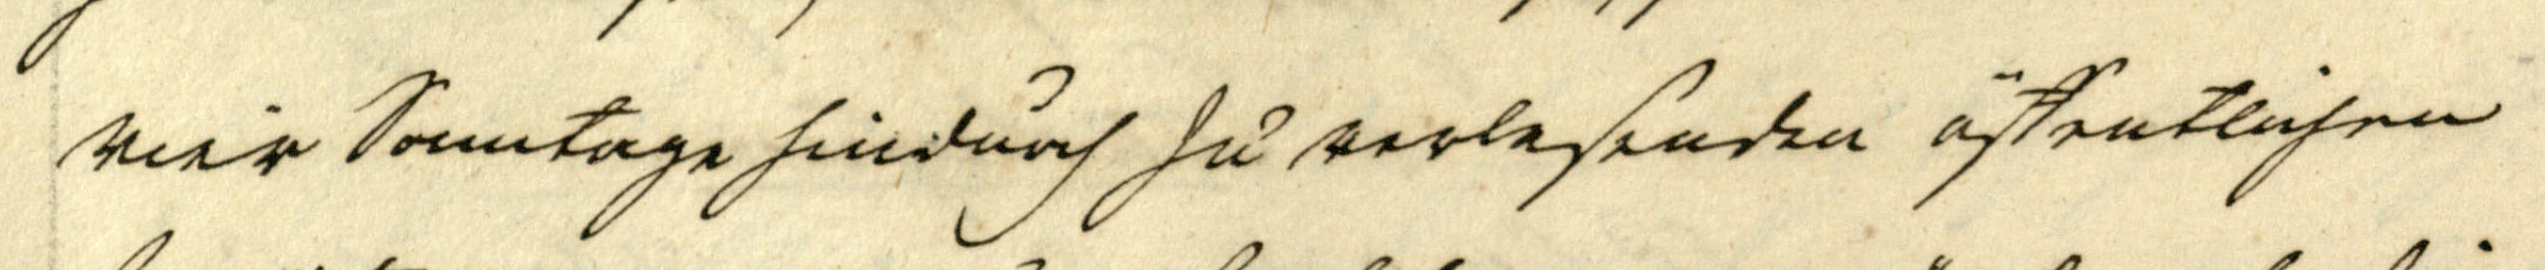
vier Sonntage hindurch zu verlesenden öffentlichen
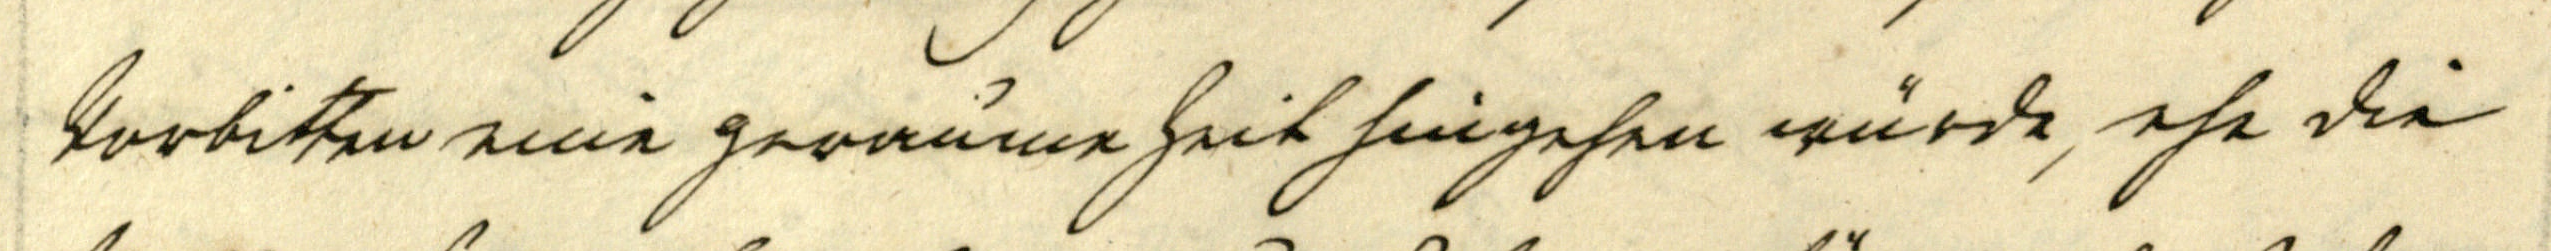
Vorbitten eine geraume Zeit hingehen würde, ehe die
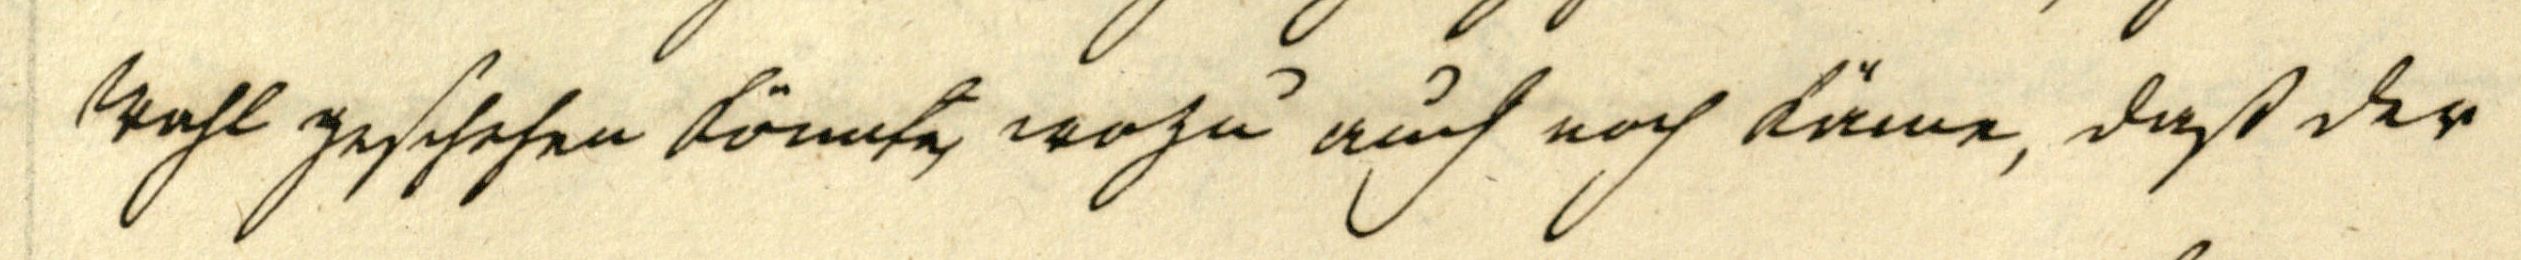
Wahl geschehen könnte, wozu auch noch käme, daß der
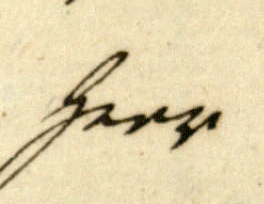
Herr
